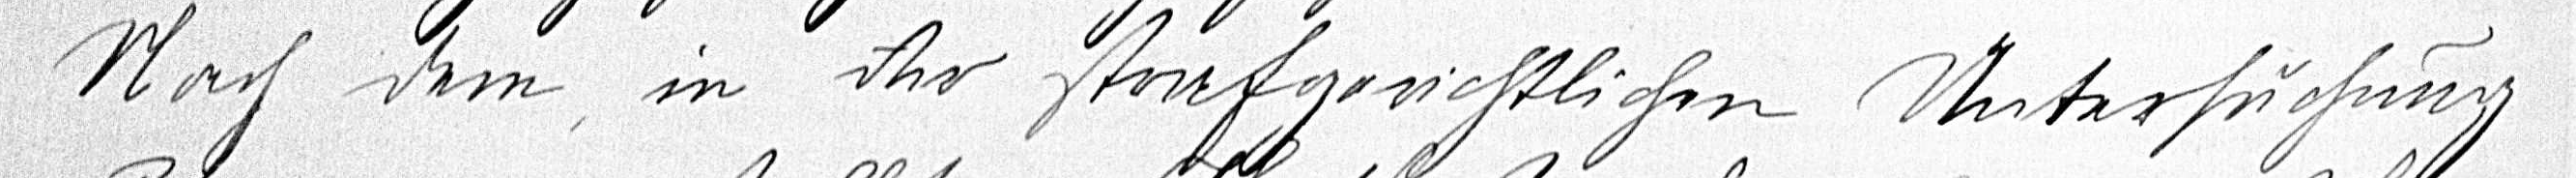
Nach dem, in der strafgerichtlichen Untersuchung
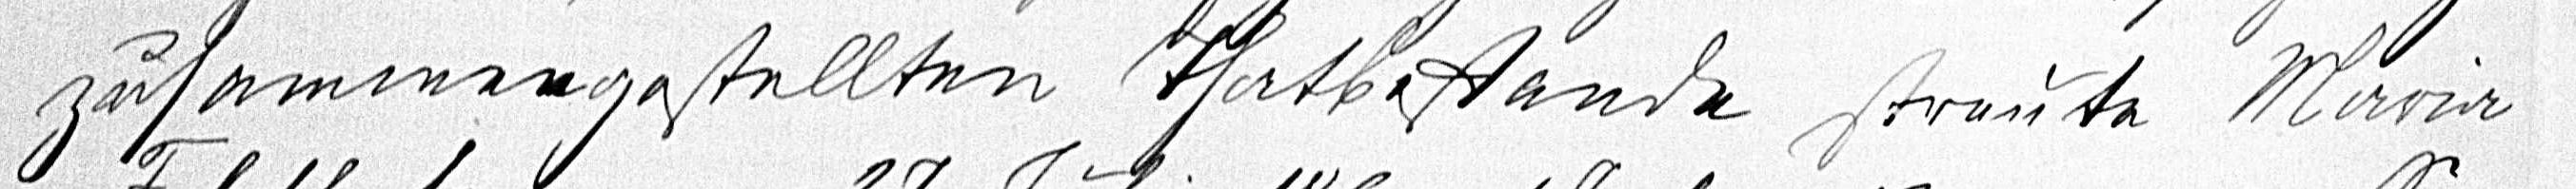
zusammengestellten Thatbestande streute Maria
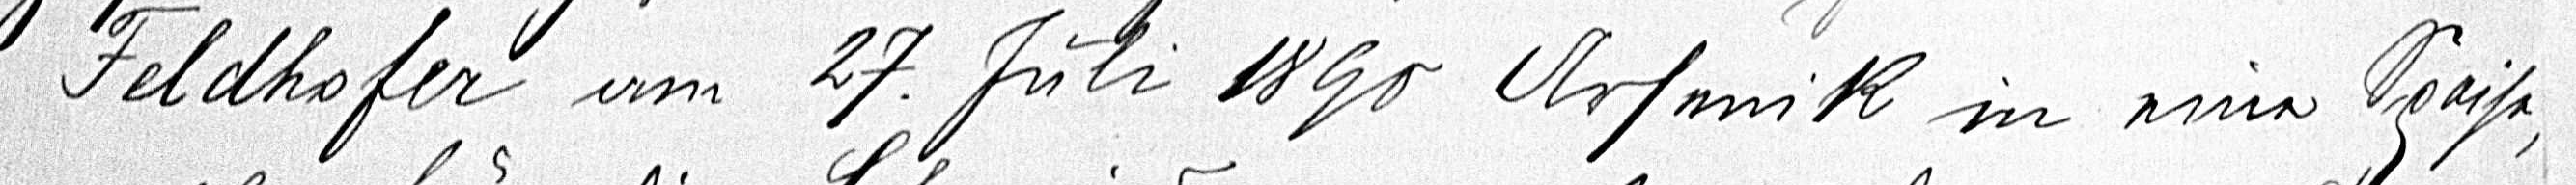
Feldhofer am 27. Juli 1890 Arsenik in eine Spaise,
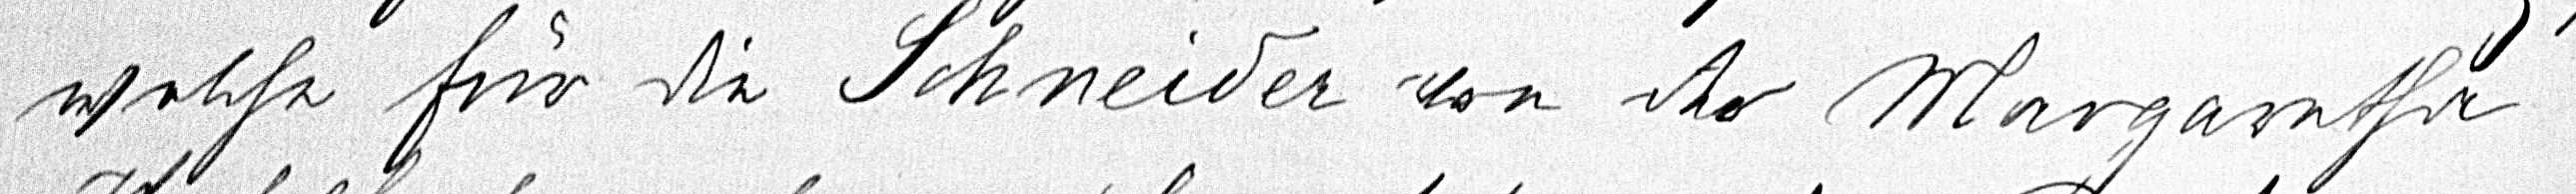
welche für die Schneider von der Margaretha
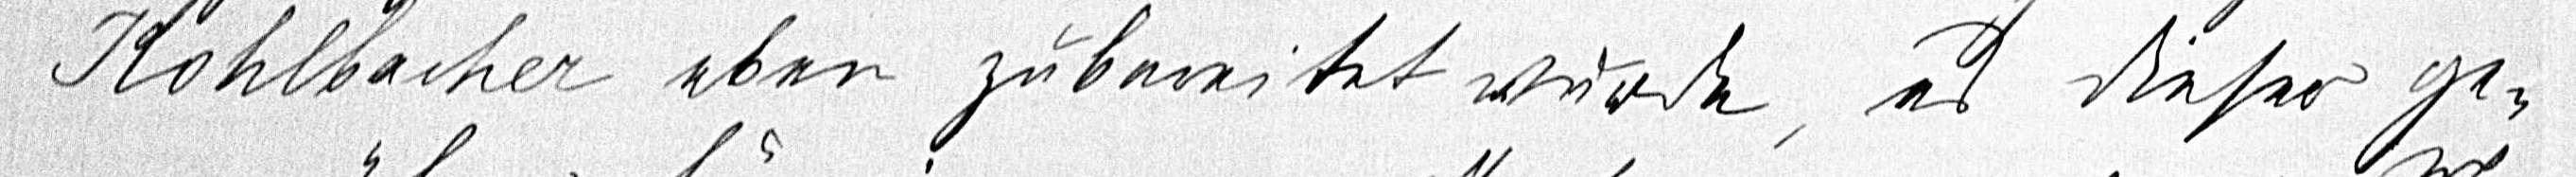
Kohlbacher eben zubereitet wurde, es dieser ge¬
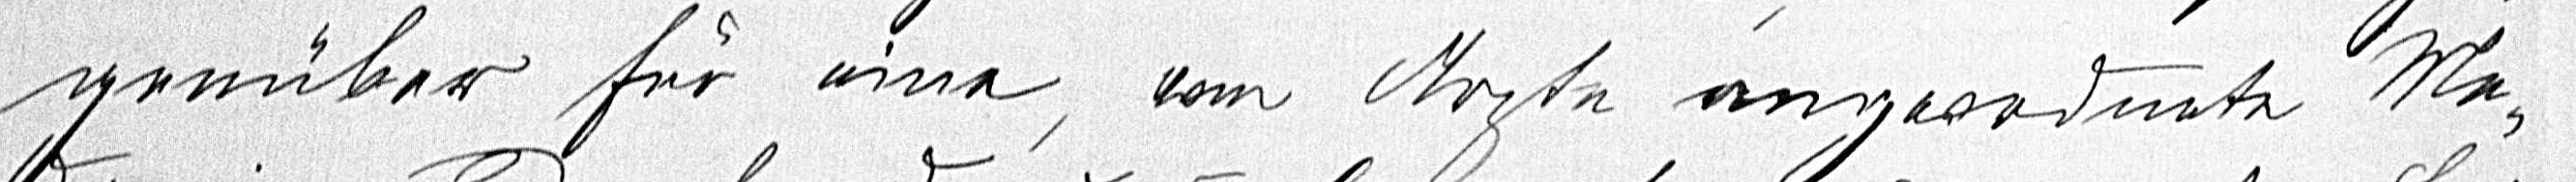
genüber für eine, vom Arzte angeordnete Me¬
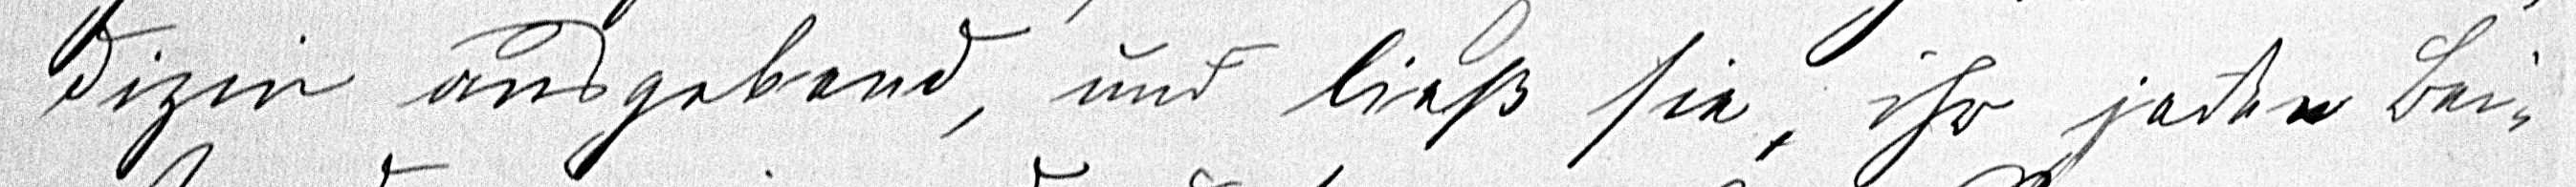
dizin ausgebend, und ließ sie, ihr jeden Bei¬
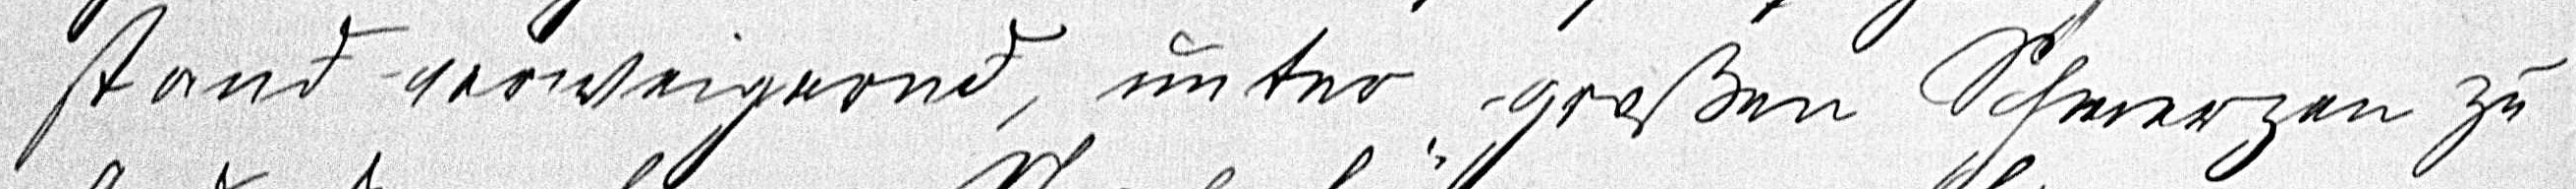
stand verweigernd, unter großen Schmerzen zu
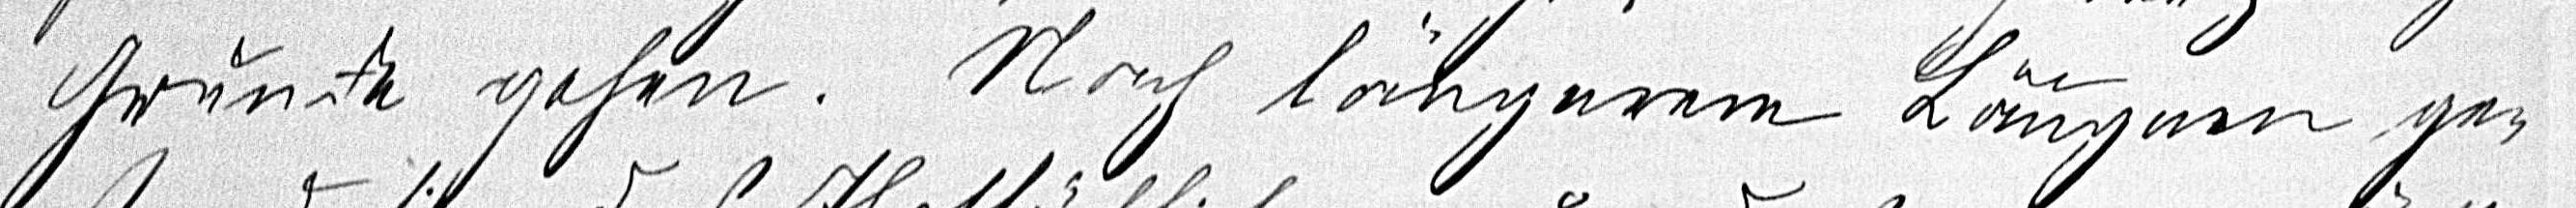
Grunde gehen. Nach längerem Läugnen, ge¬
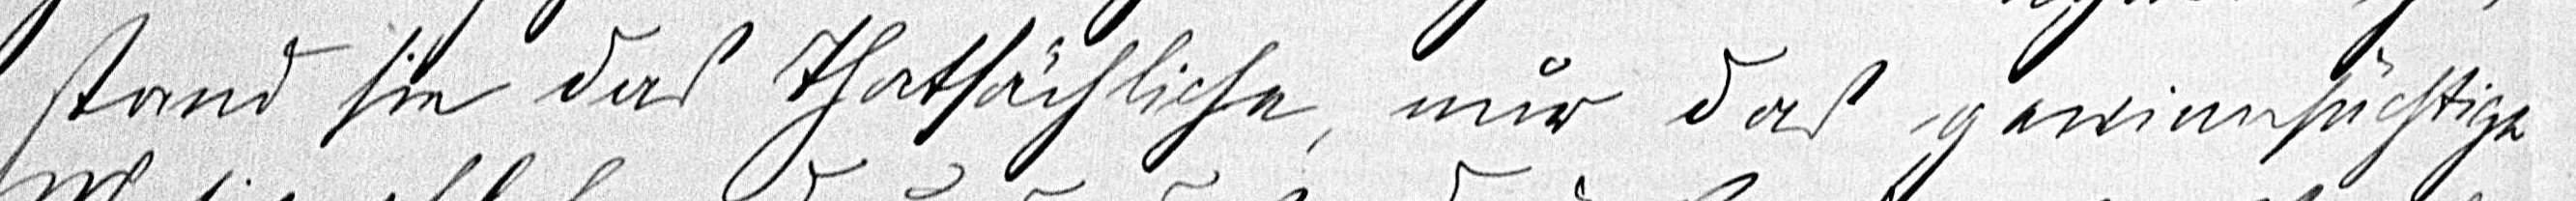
stand sie das Thatsächliche, nur das gewinnsüchtigte
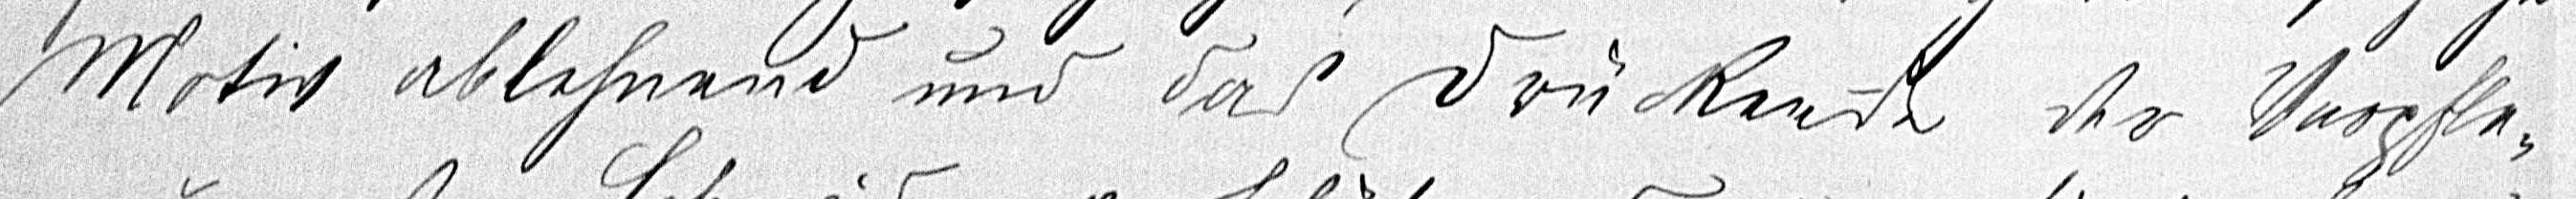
Motiv ablehnnd und das drückende der Verpfle¬
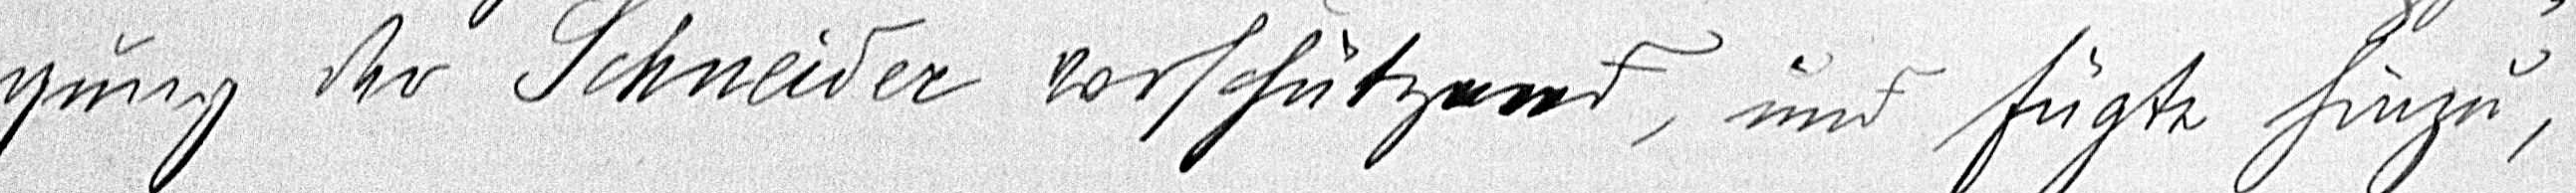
gung der Schneider vorschützend, und fügte hinzu
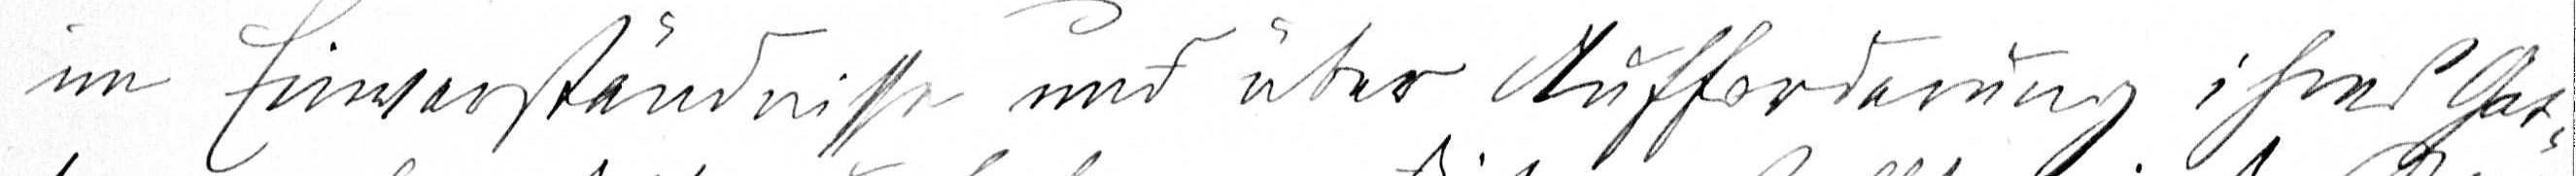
im Einverständnisse und über Aufforderung ihres Gat¬
